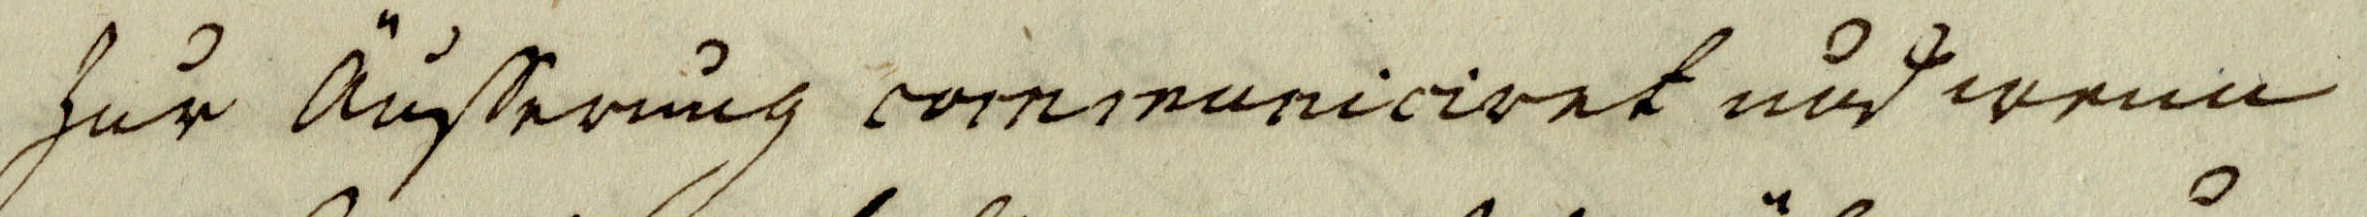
zur Äusserung communiciret und wenn
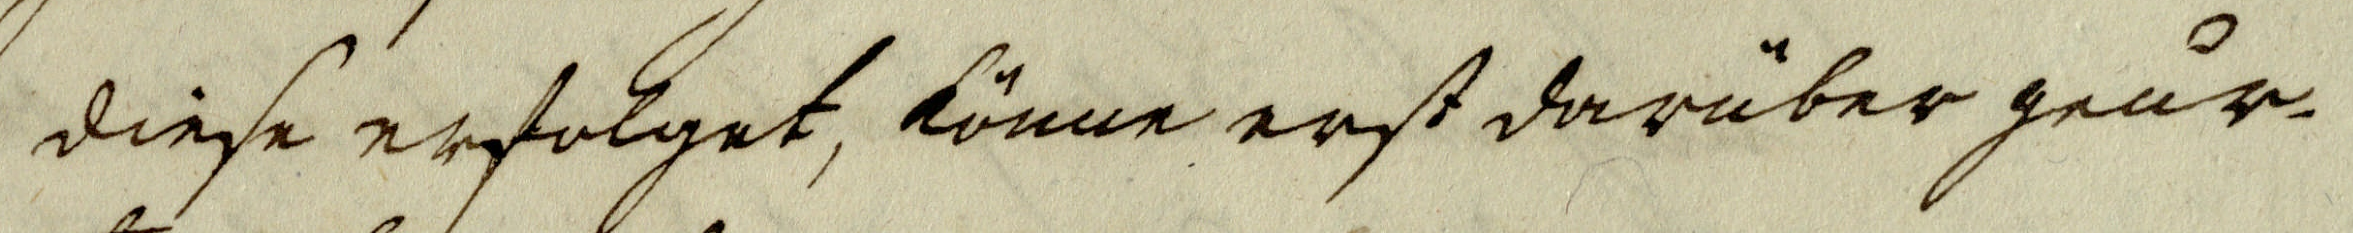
diese erfolget, könne erst darüber geur¬
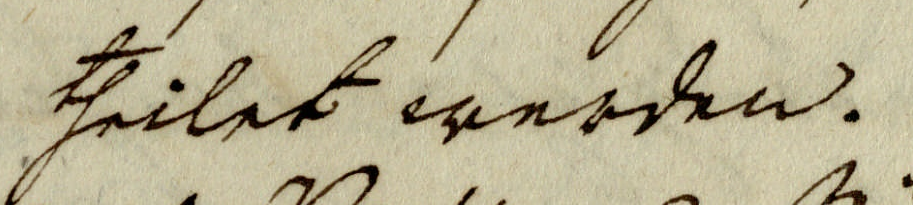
theilet werden.
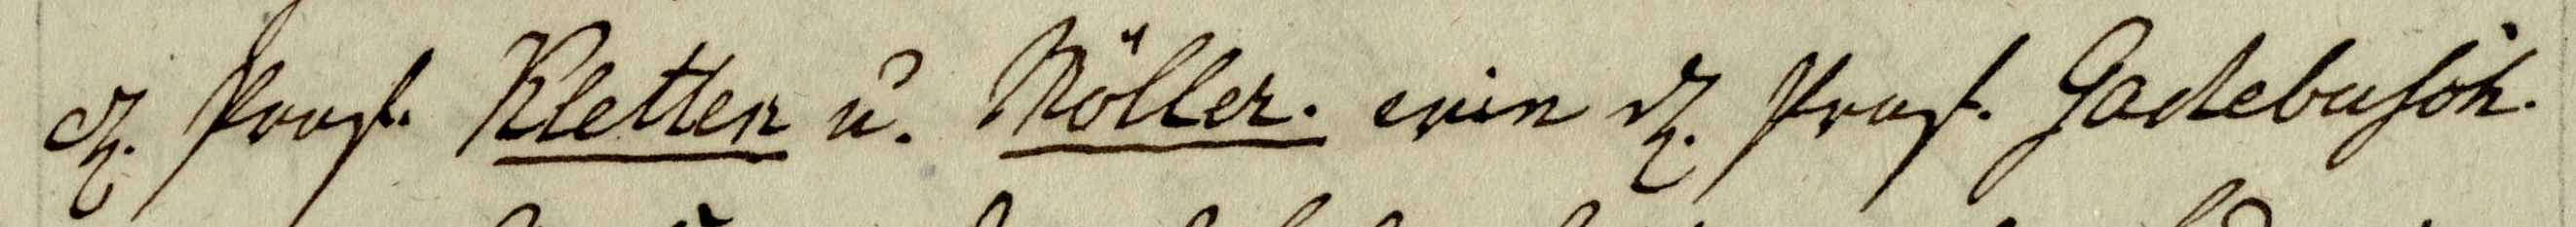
dh. Prof. Kletten u. Möller. wie dh. Prof. Gadebusch.
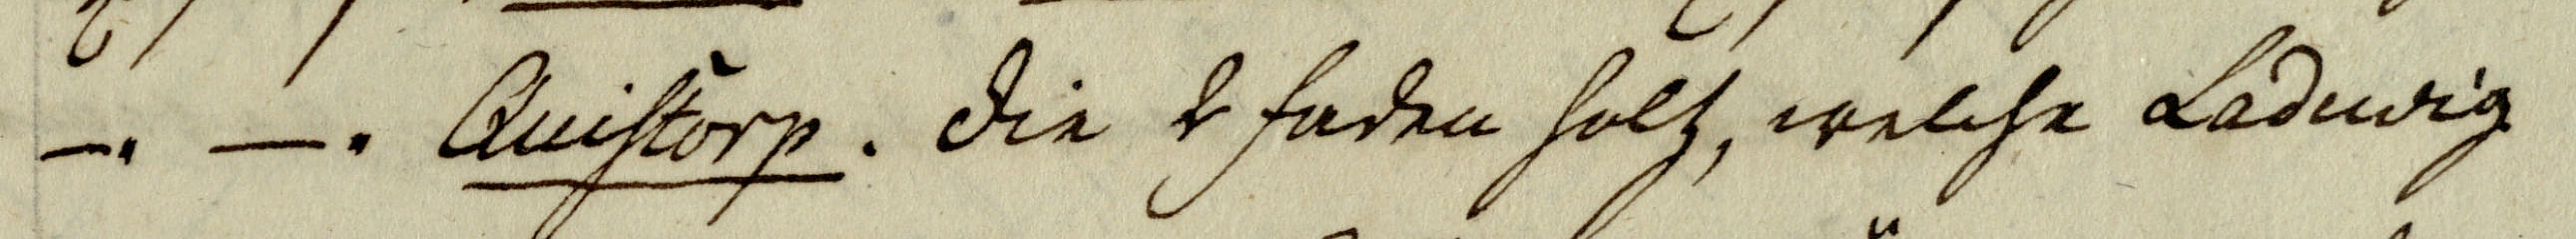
— " — " Quistorp. Die 2 Faden Holz, welche Ladewig
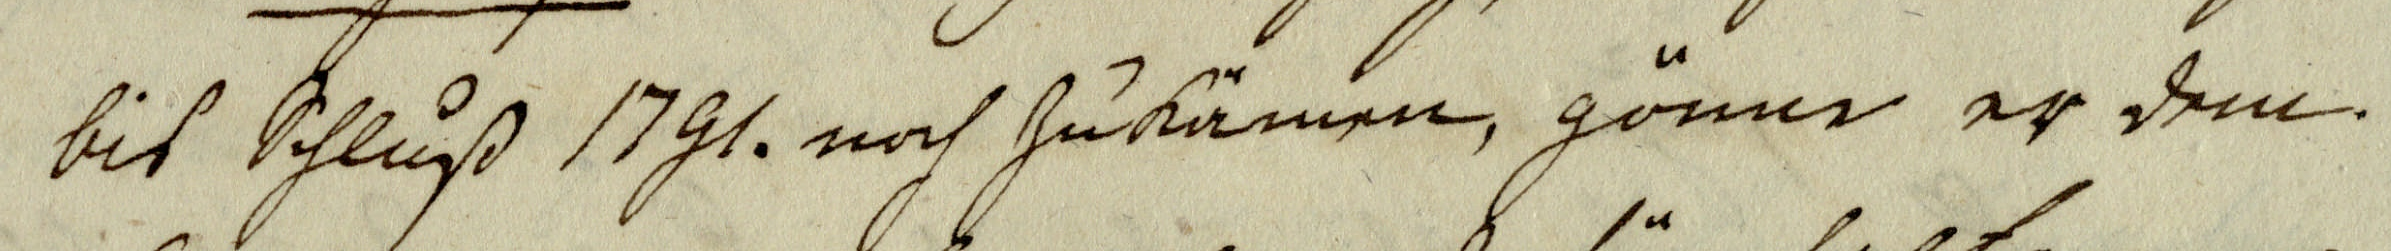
bis Schluß 1791. noch zukämen, gönne er dem¬
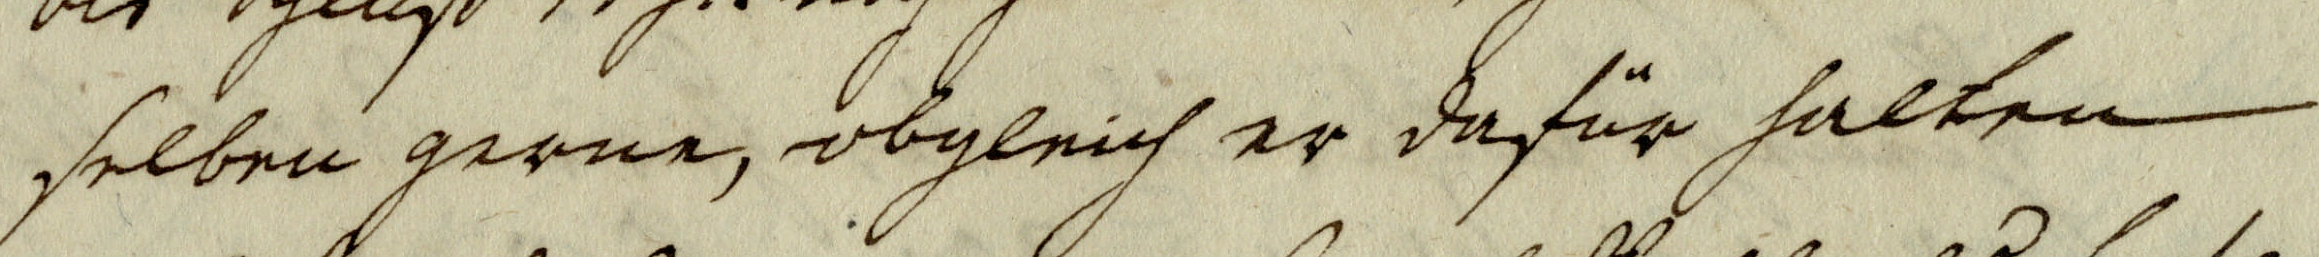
selben gerne, obgleich er dafür halten
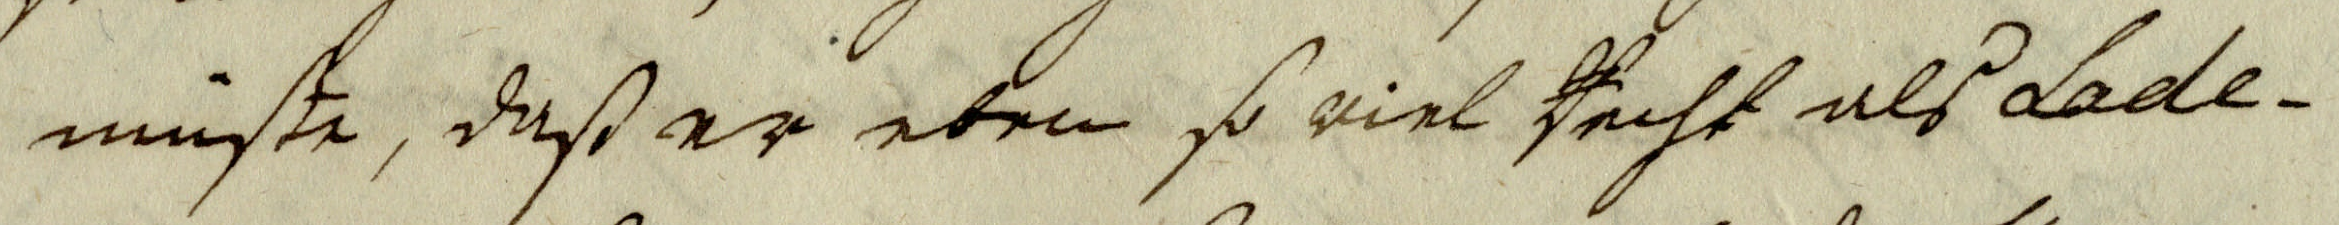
müsste, daß er eben so viel Recht als Lade¬
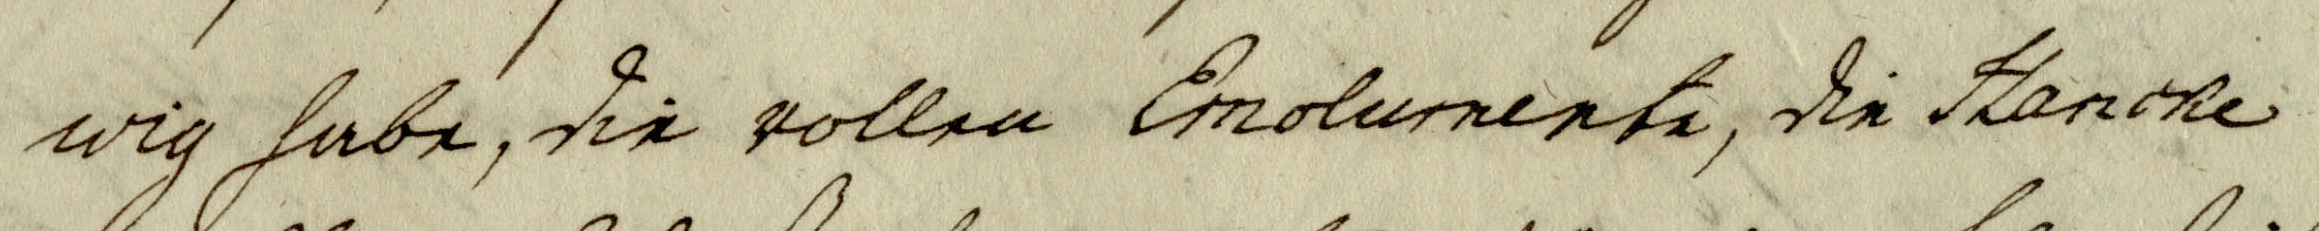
wig habe, die vollen Emolumente, die Hancke
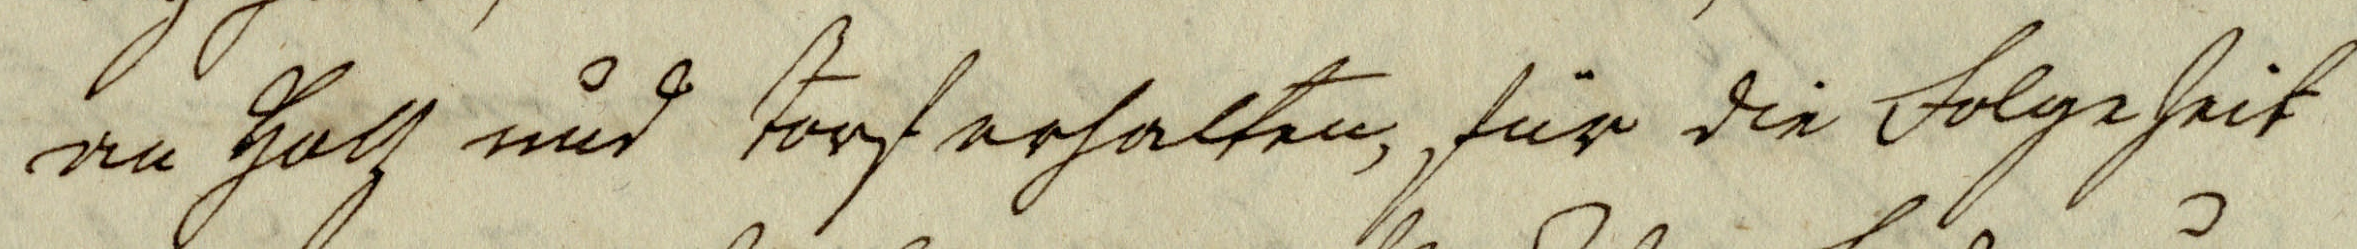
an Holz und Torf erhalten, für die Folgezeit
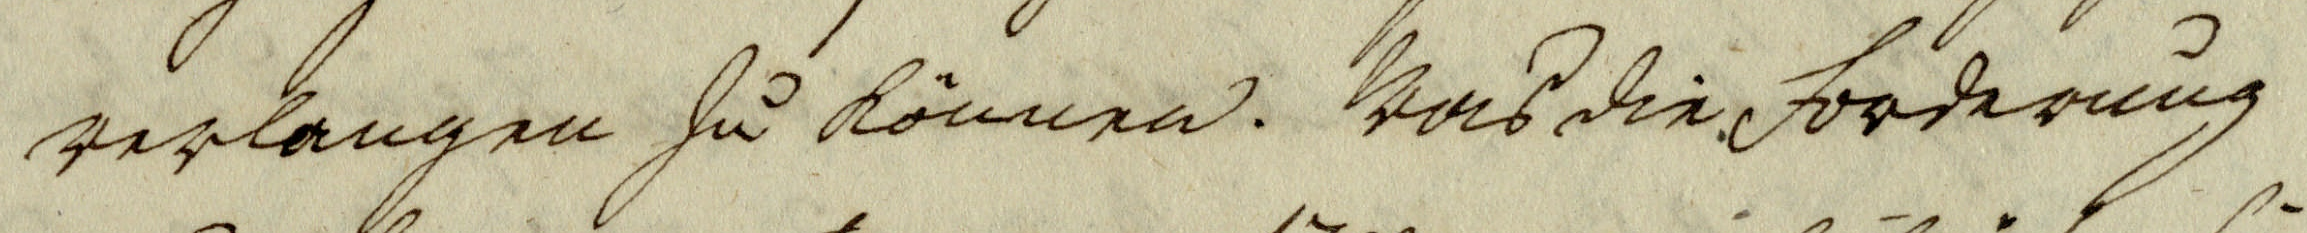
verlangen zu können. Was die Forderung
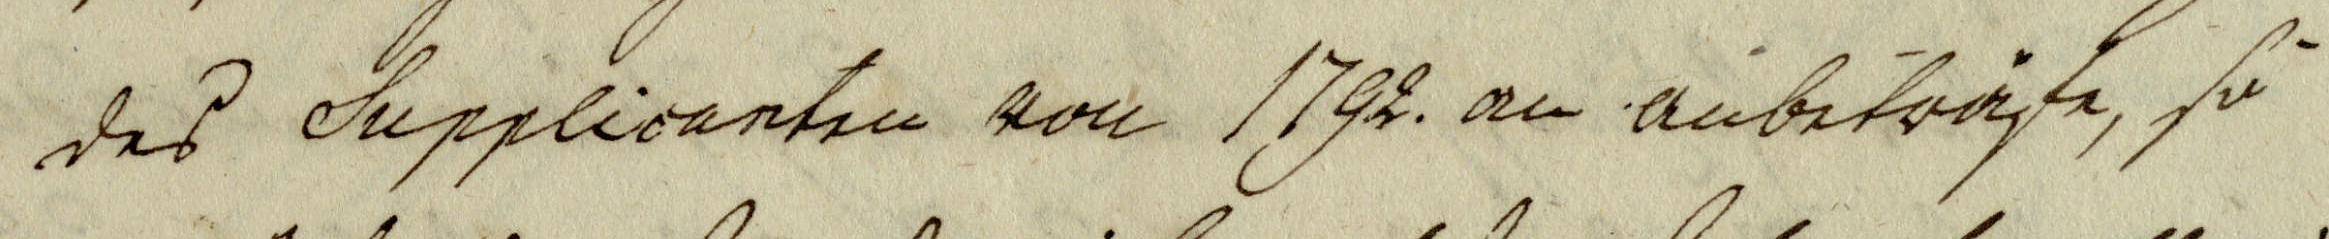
des Supplicanten von 1792. an anbeträfe, so
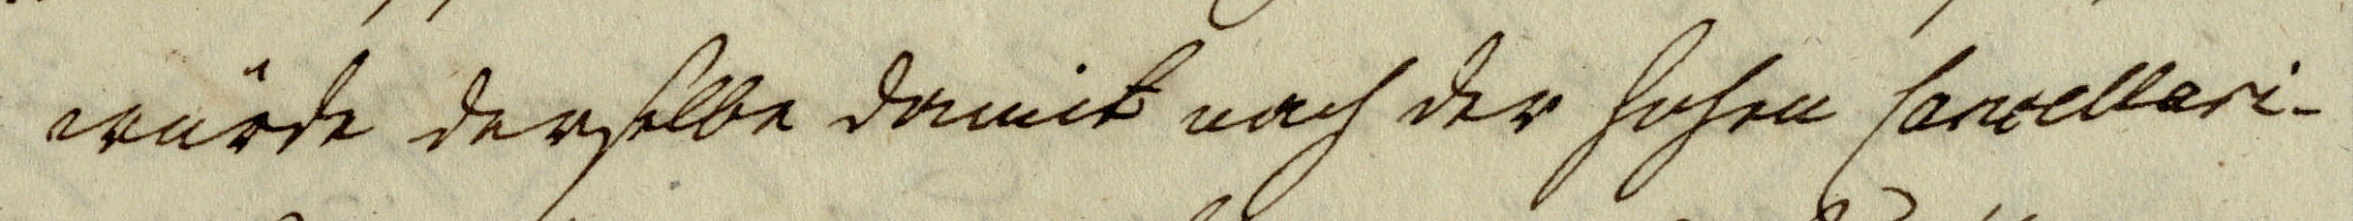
würde derselbe damit nach der hohen Cancellari¬
